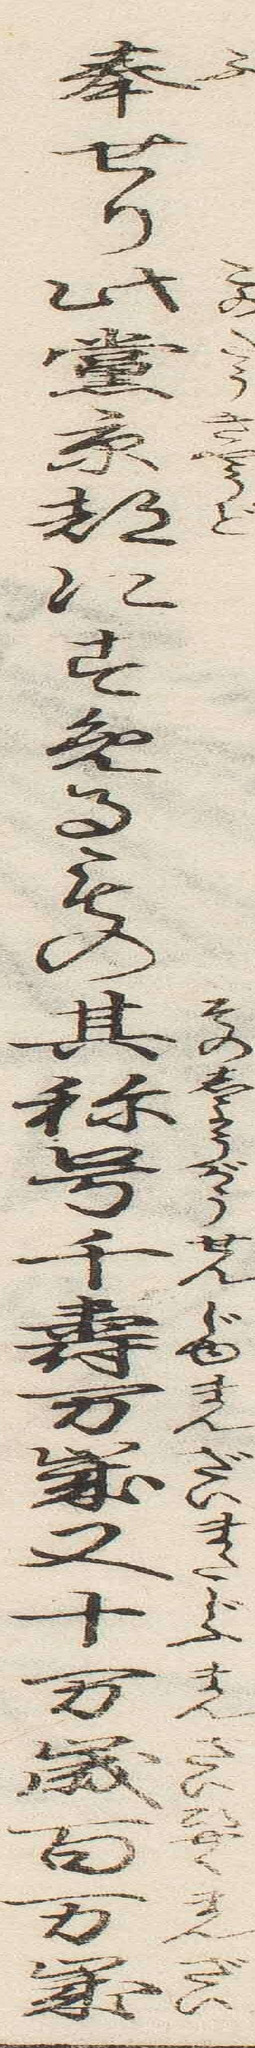奉せり此黨京都にすめるもの其称号千壽万歳又十万歳百万歳
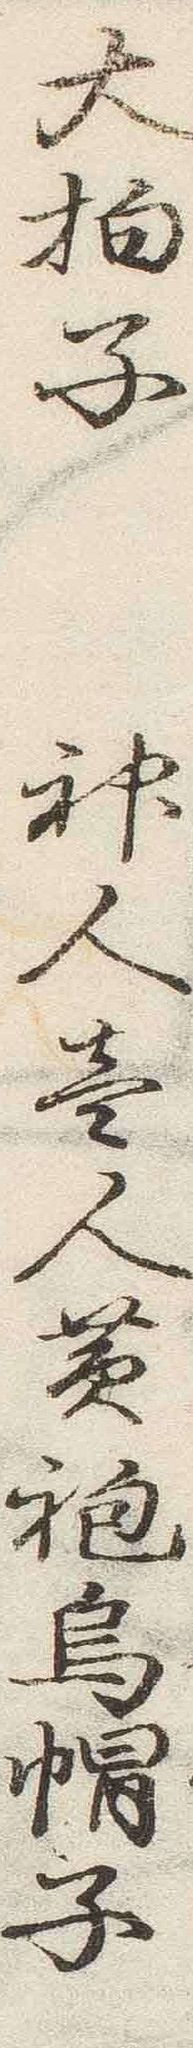大拍子神人壱人黄袍烏帽子
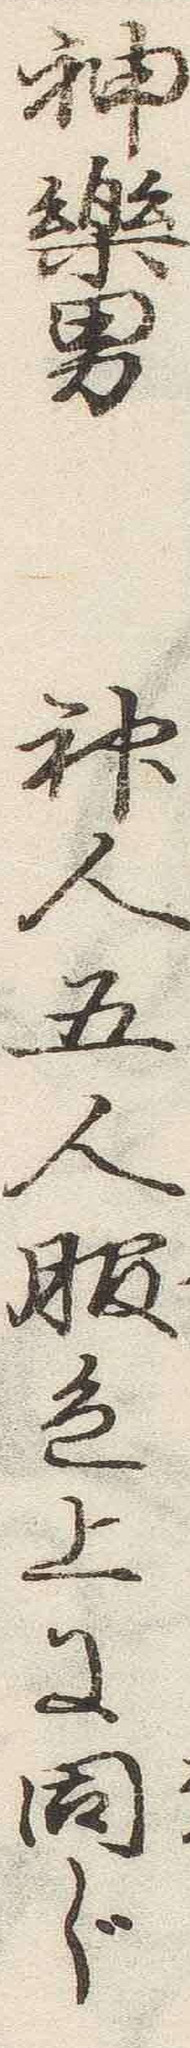神樂男神人五人服色上に同じ
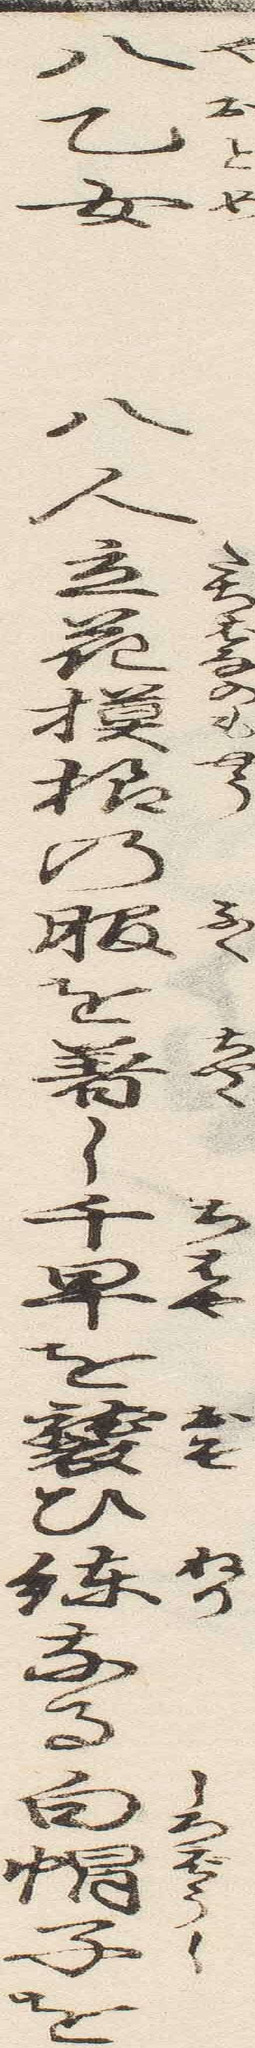八乙女八人立花摸様の服を着し千早を襲ひ練なる白帽子を
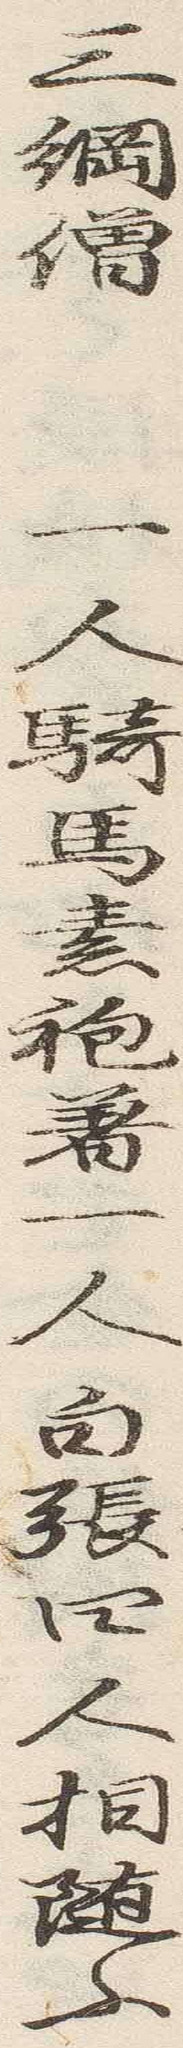三綱僧一人騎馬素袍着一人白張四人相随ふ
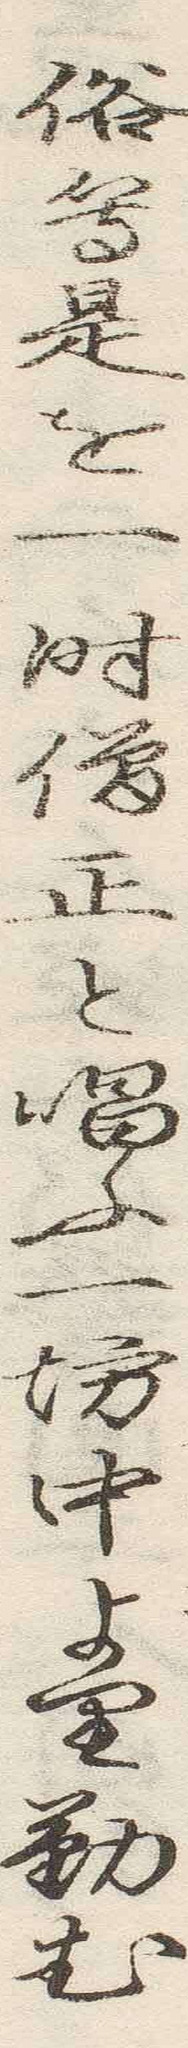俗等是を一时僧正と唱ふ一坊中より勤む
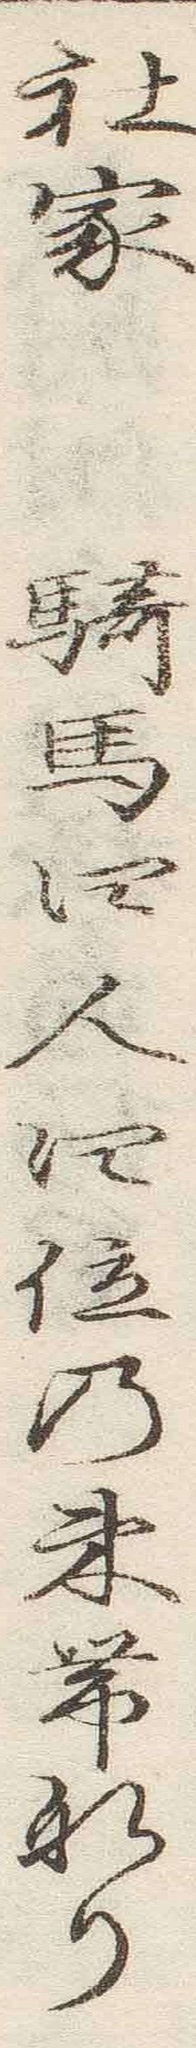社家騎馬四人四位の束帯なり
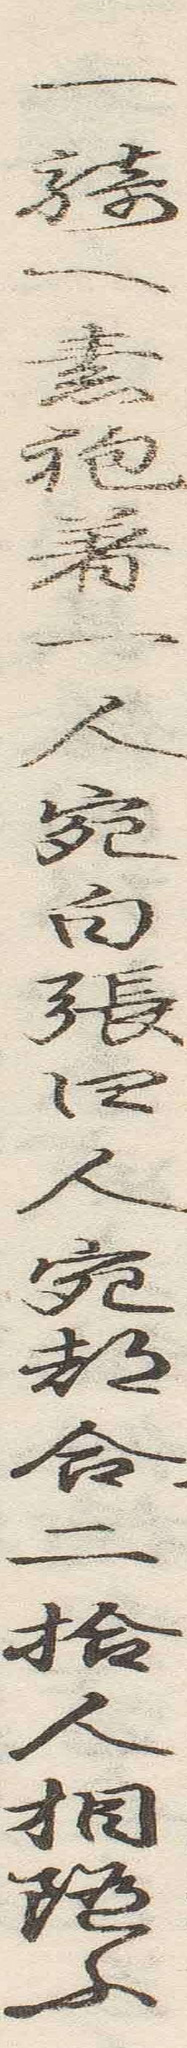一騎へ素袍着一人宛白張四人宛都合二拾人相随ふ
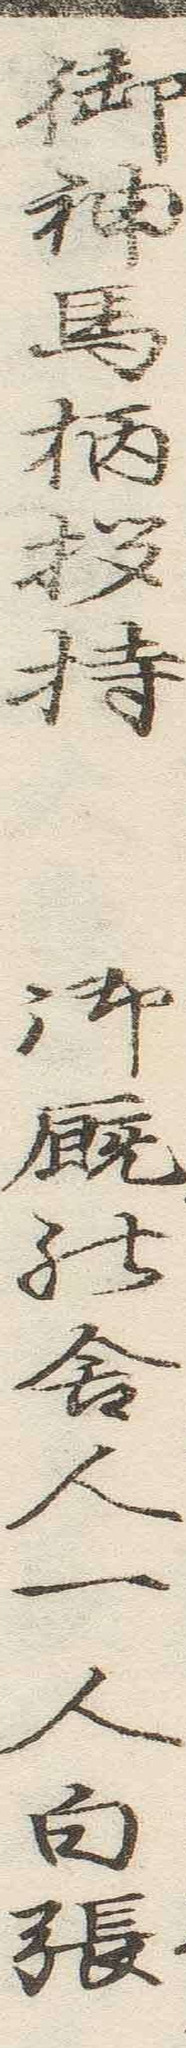御神馬柄拶持御厩の舎人一人白張
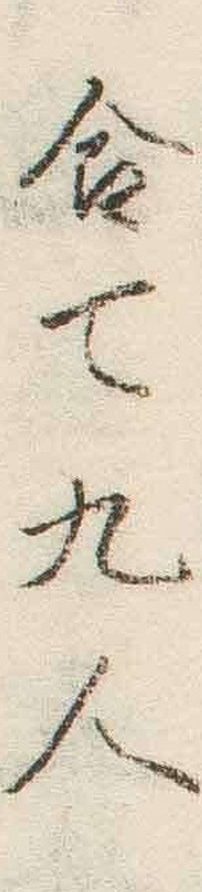合て九人
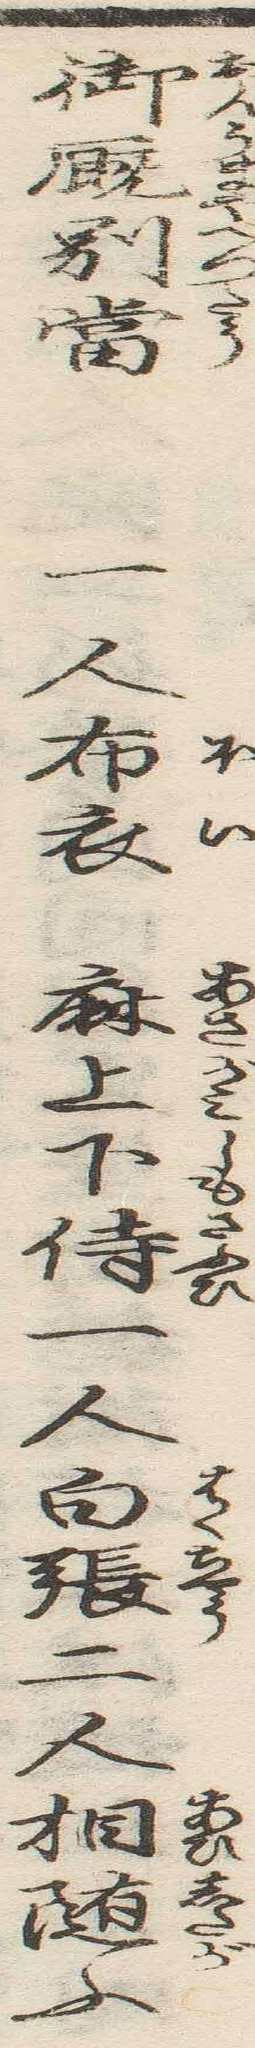御厩別當一人布衣麻上下侍一人白張二人相随ふ

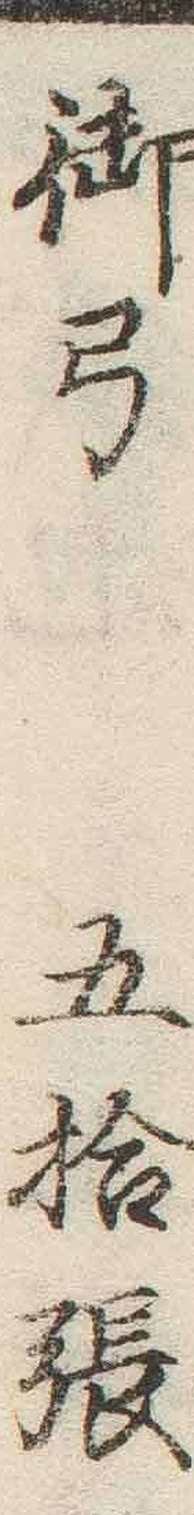御弓五拾張
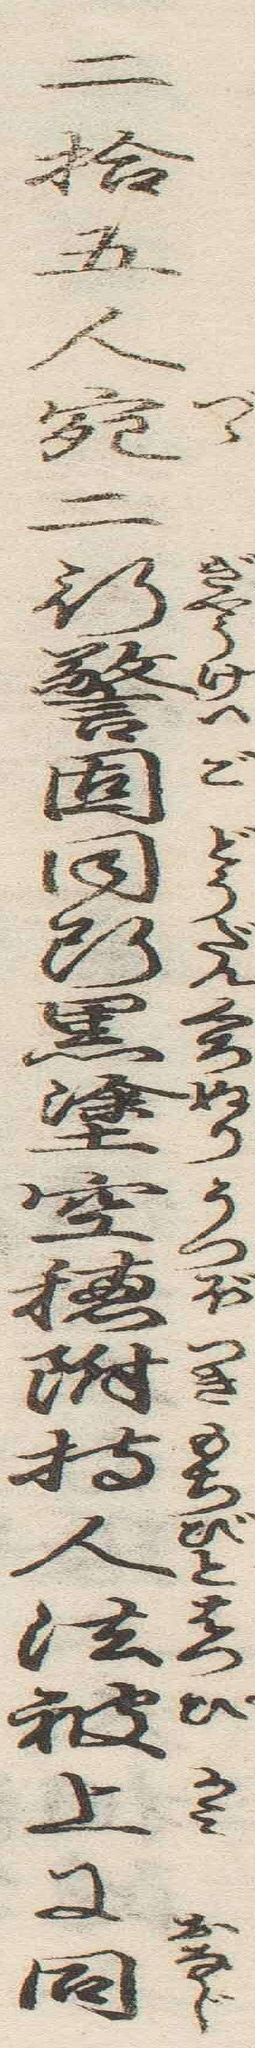二拾五人宛二行警固同断黒塗空穂附持人法被上に同
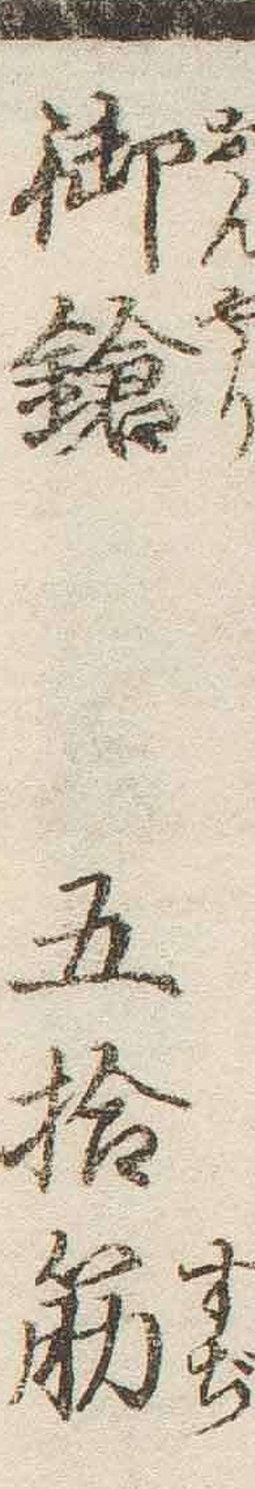御鎗五拾筋
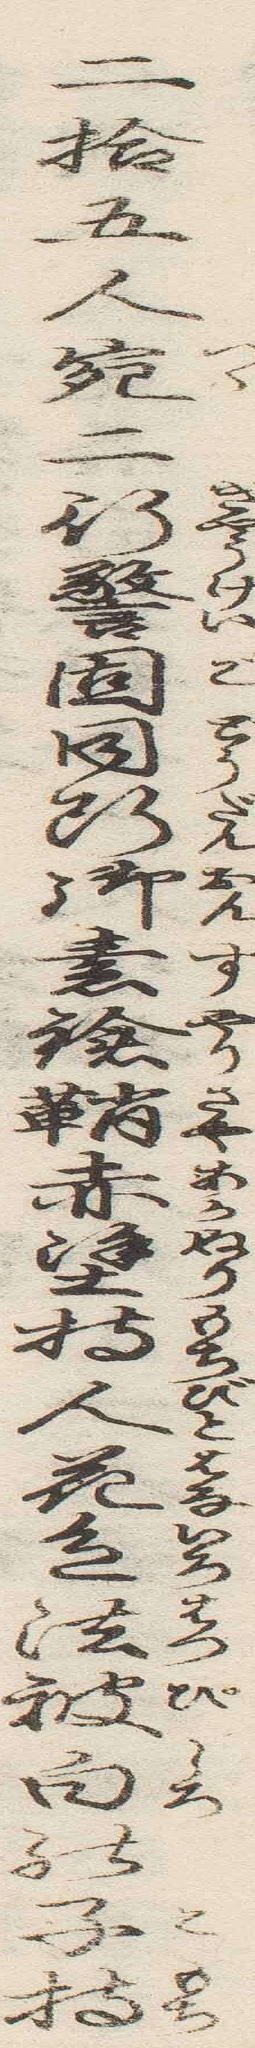二拾五人宛二行警固同断御素鎗鞘赤塗持人花色法被白の子持
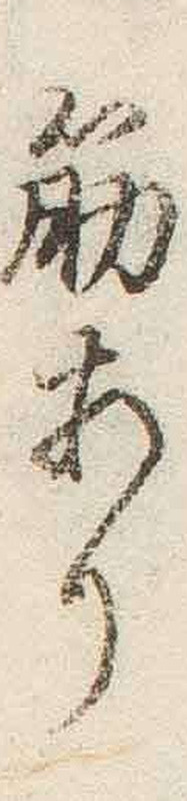筋あり
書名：日光山志
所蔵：東京学芸大学附属図書館 国文学研究資料館
